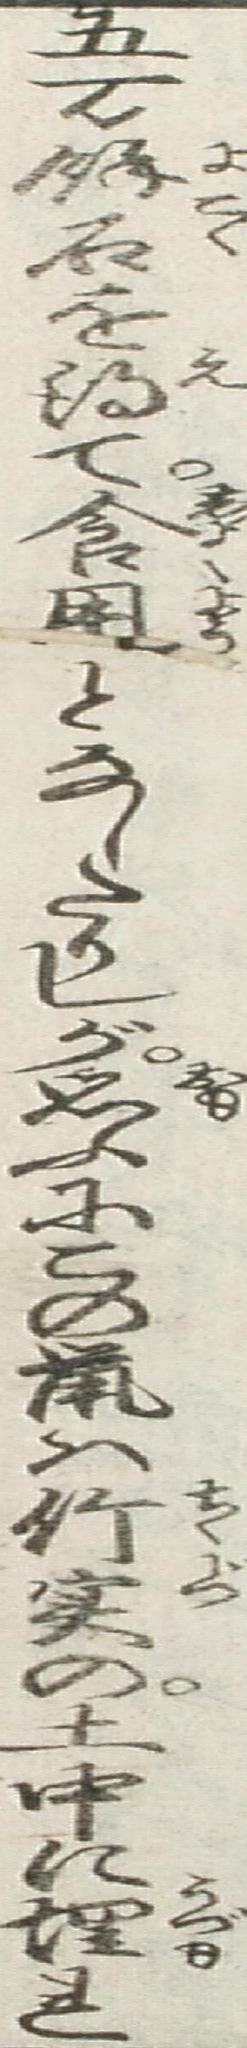五万余石を得て。食用となしたりしが。思ふにこの鼠は竹実の。土中に埋れ
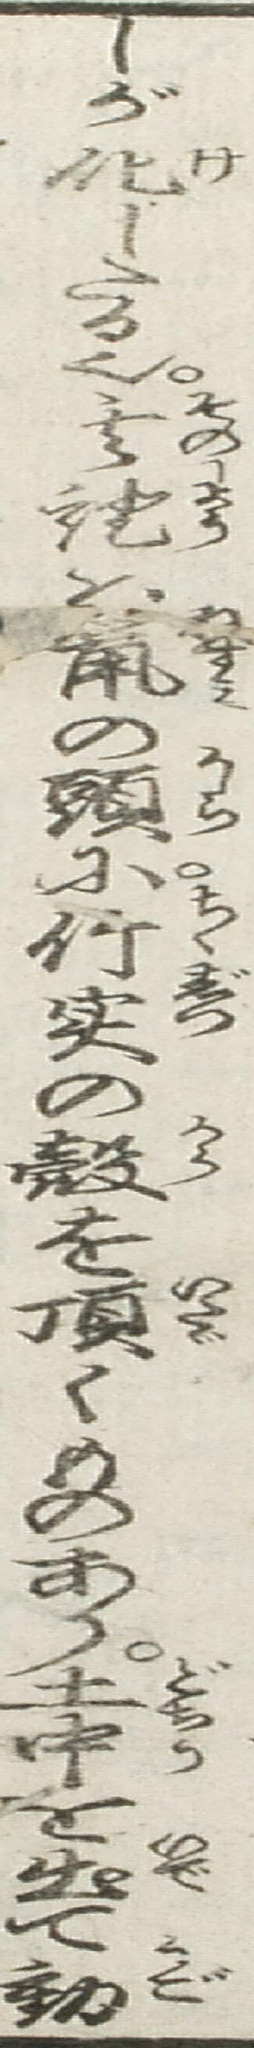しが化したる也。其證は鼠の頭に。竹実の殻を頂くものあり。土中を出て動
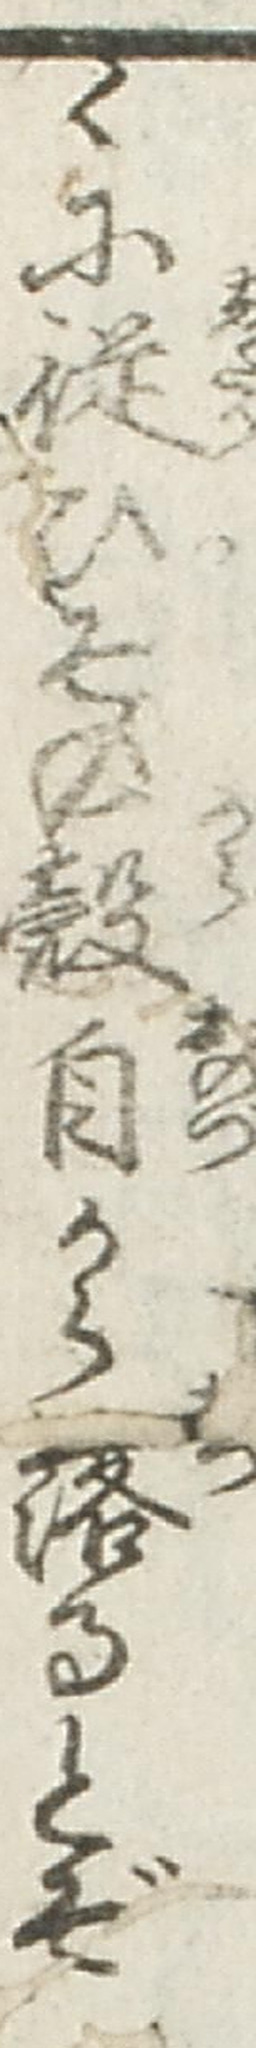くに従ひその殻自から落るとぞ
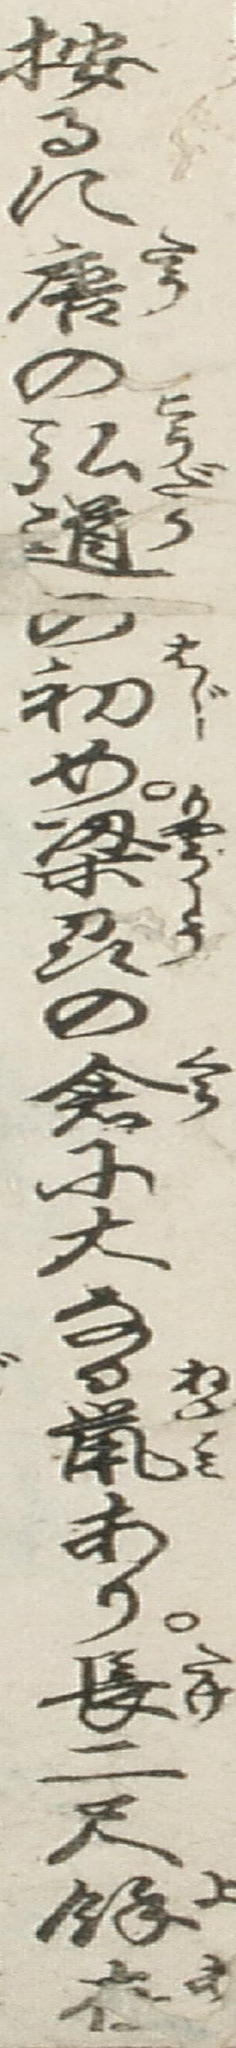按るに唐の弘道の初め。梁州の倉に大なる鼠あり。長二尺余在
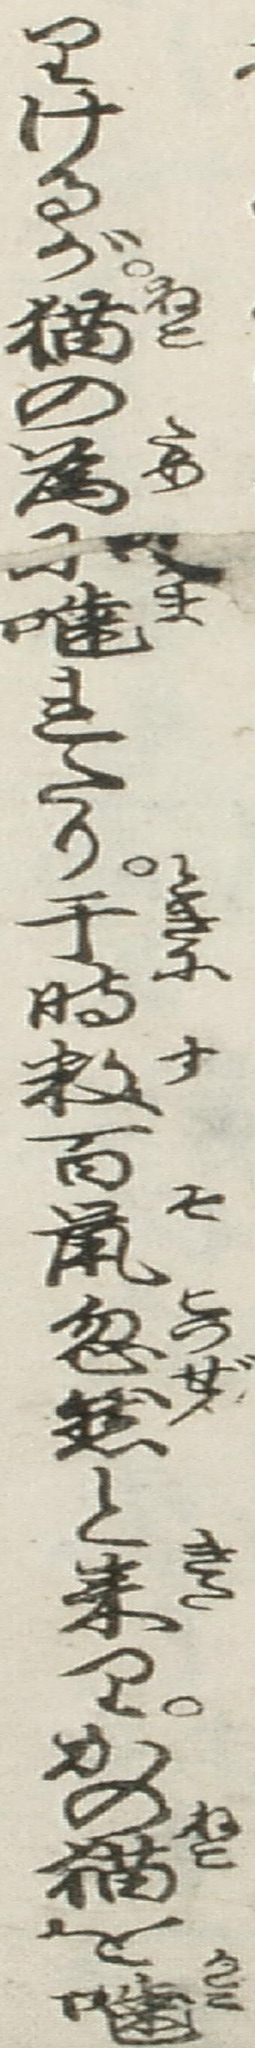りけるが。猫の為に噛れたり。于時数百鼠忽然と来り。かの猫を噛
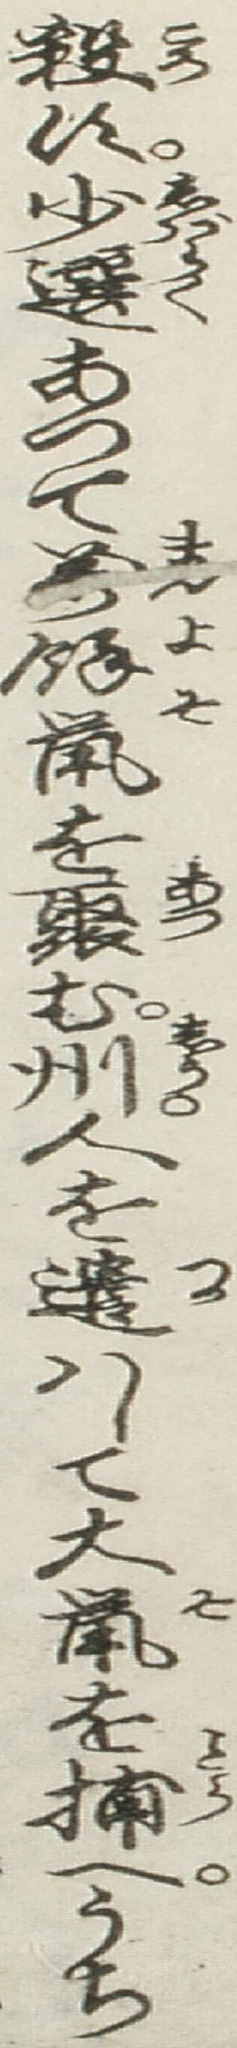殺す。少選あつて萬余鼠を聚む。州。人を遣はして大鼠を捕へ。うち
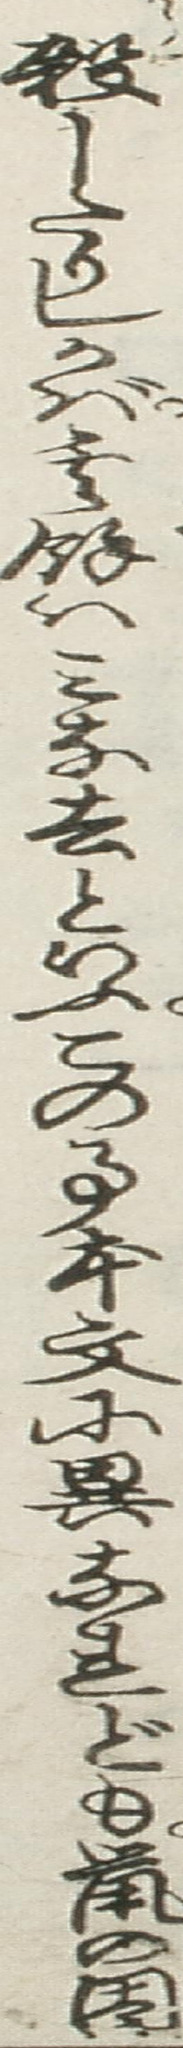殺したりしかば。其余はみな去といふ。この事本文に異なれども。鼠の因
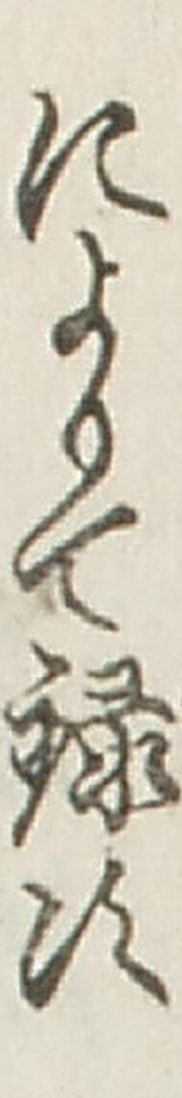によりて録す
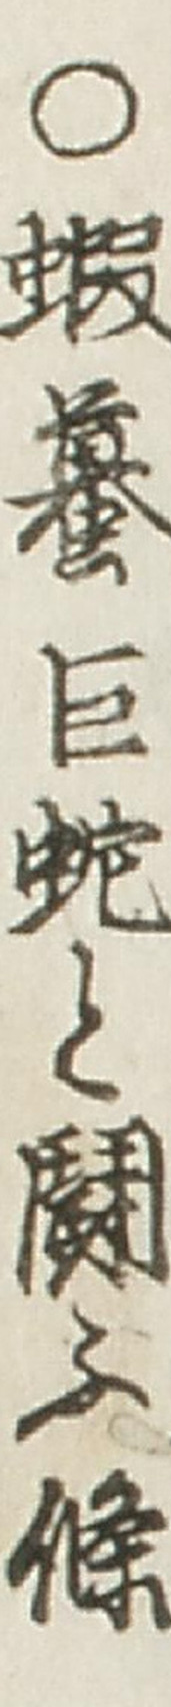〇蝦蟇巨蛇と闘ふ條
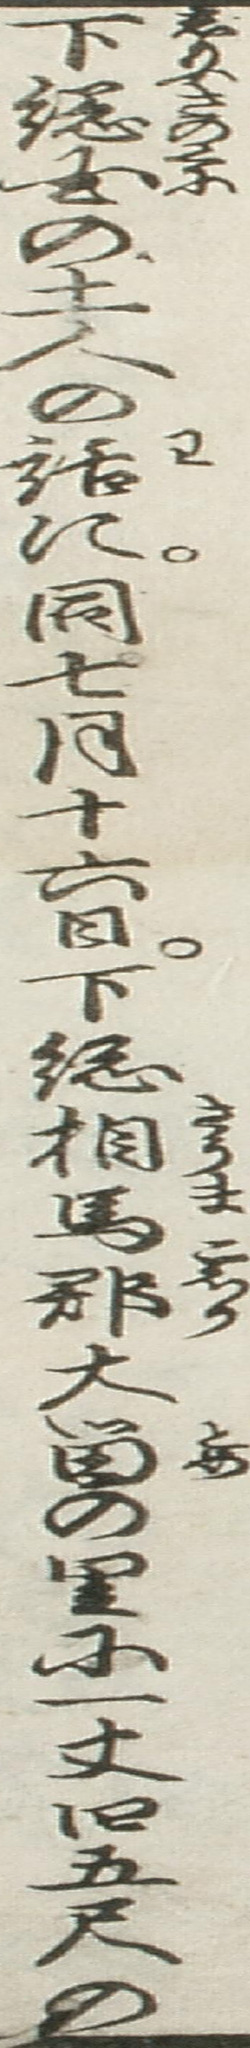下総国の土人の話に。同七月十六日。下総相馬郡大留の里に一丈四五尺の
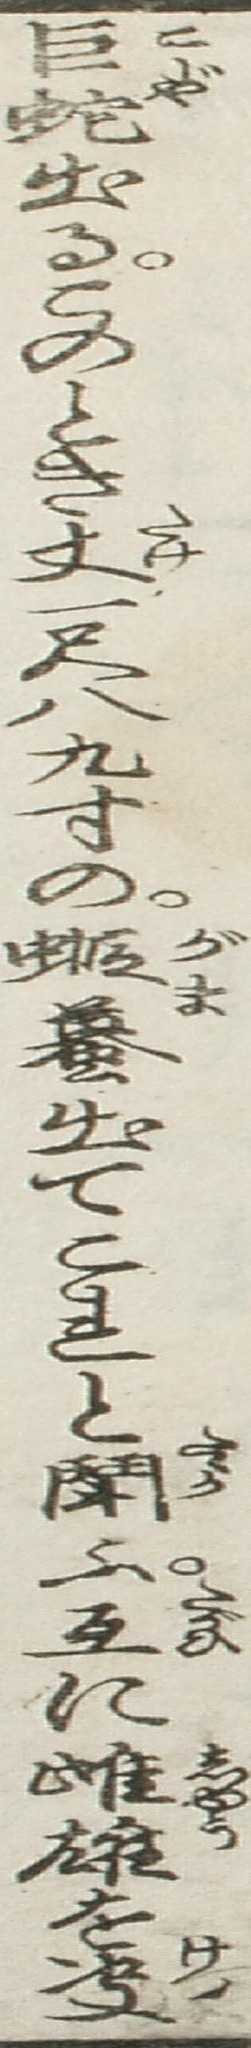巨蛇出る。このとき丈一尺八九寸の。蝦蟇出てこれと闘ふ。互に雌雄を決
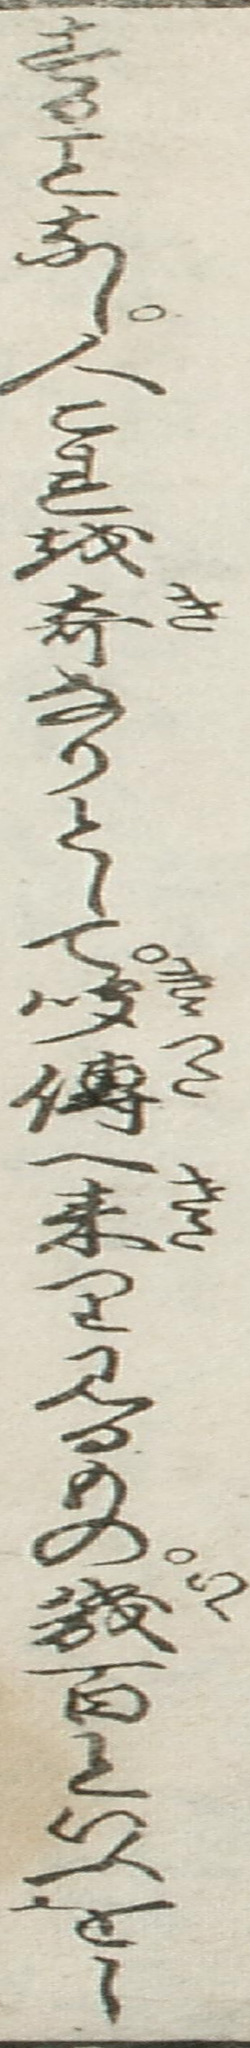することなし。人これを奇なりとして。聞伝へ来り見るもの。幾百といふをし
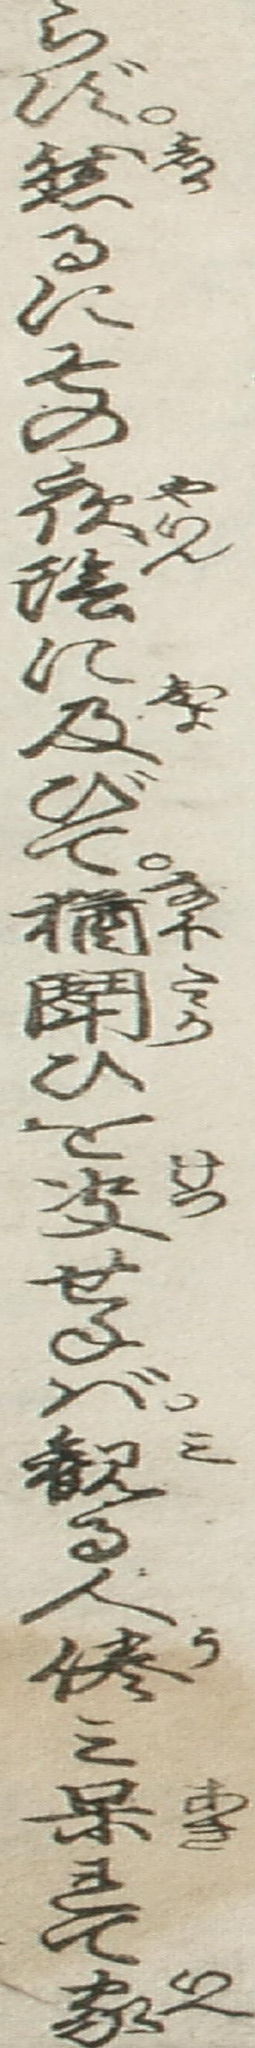らず。然るにその夜陰に及びて。猶闘ひを決せねば。観る人倦み呆れて家
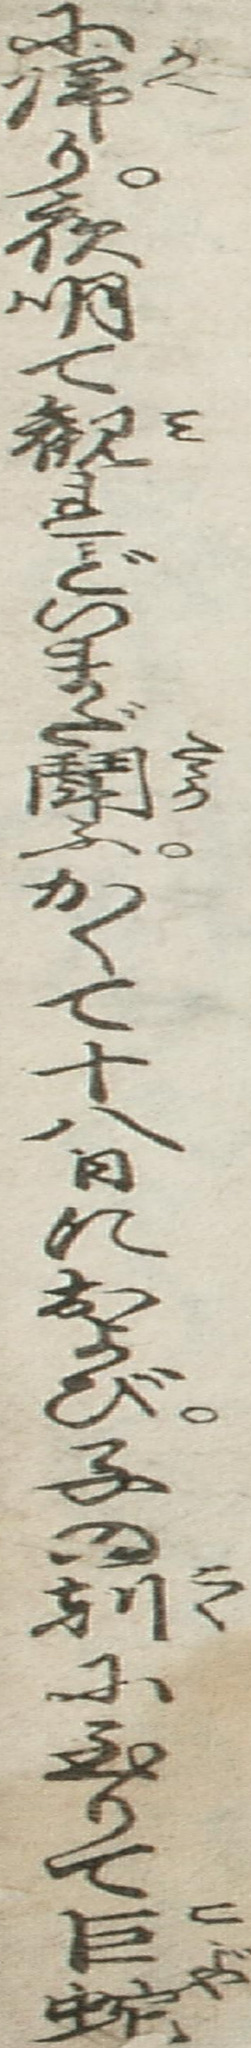に帰り。夜明て観れどいまだ闘ふ。かくて十八日におよび。子の刻に至りて巨蛇

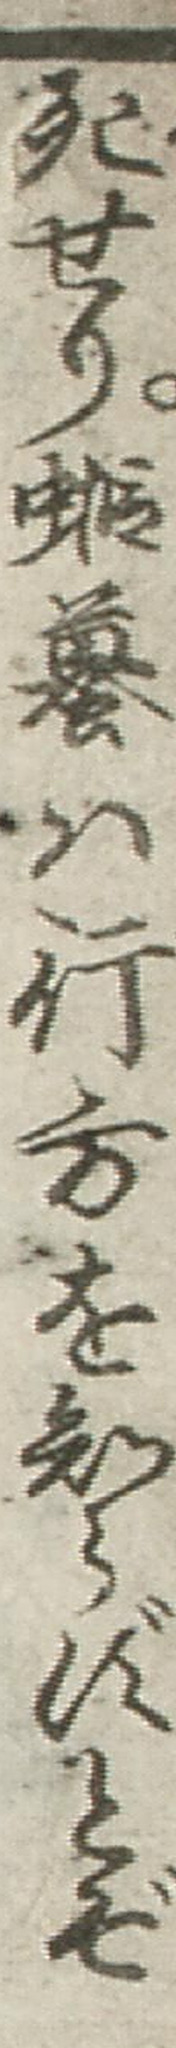死せり。蝦蟇は行方を知らずとぞ
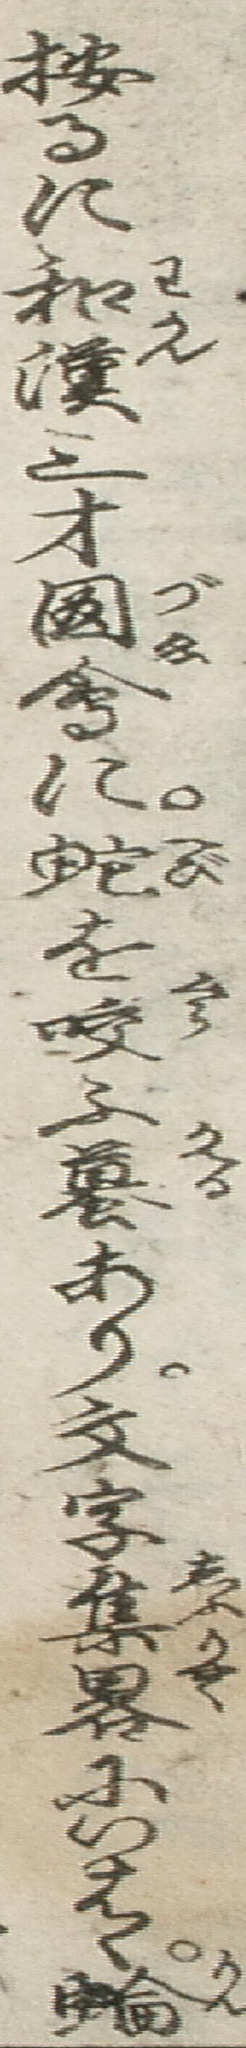按るに和漢三才図会に。蛇を咬ふ蟇あり。文字集略にいはく。蜦
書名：安政見聞録　下
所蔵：東京大学地震研究所図書室 Earthquake Research Institute Library, The University of Tokyo, JAPAN
